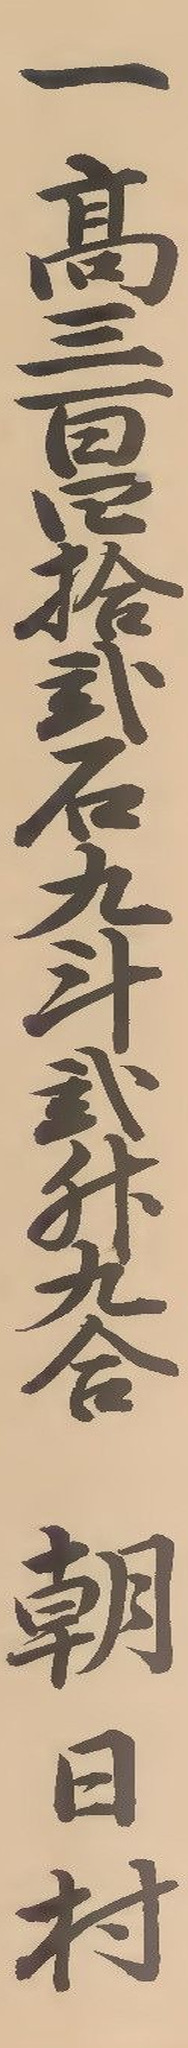一高三百四拾弐石九斗弐升九合朝日村
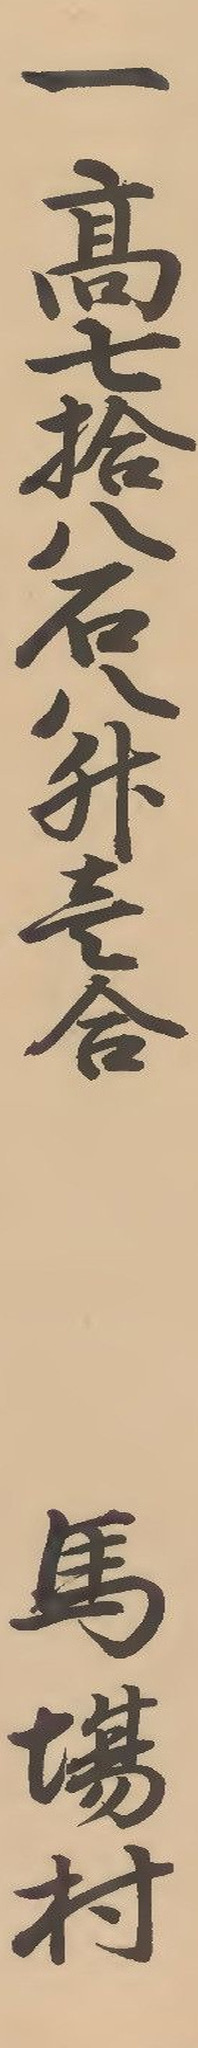一高七拾八石八升壱合馬場村
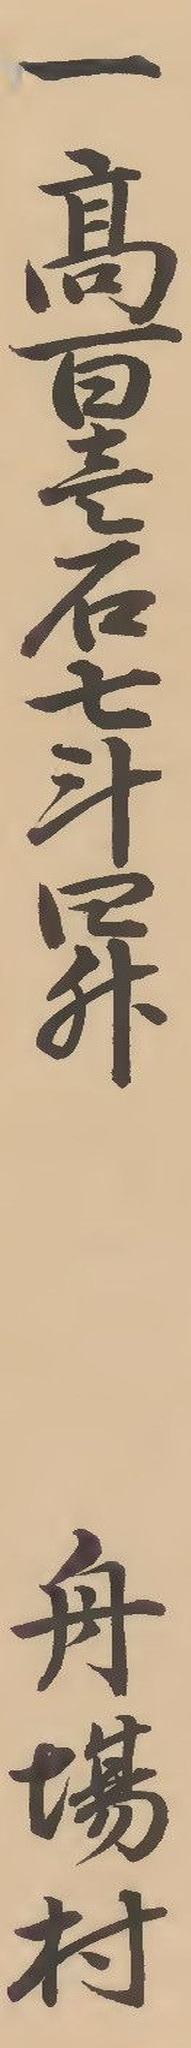一高百壱石七斗四升舟場村

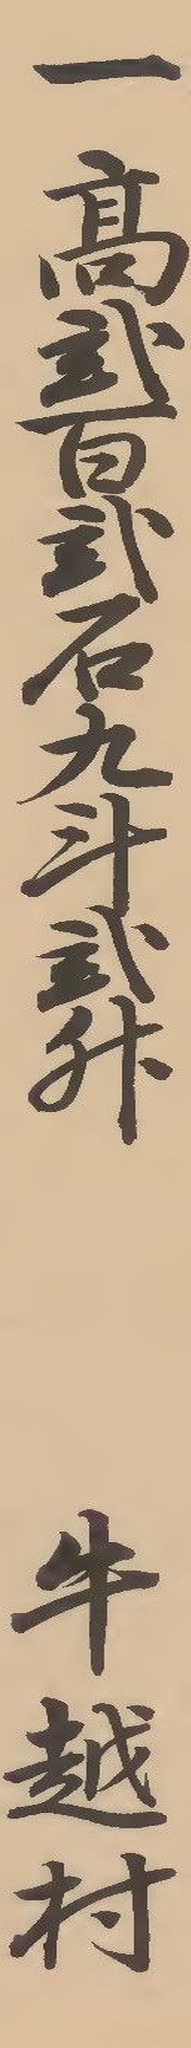一高弐百弐石九斗弐升牛越村
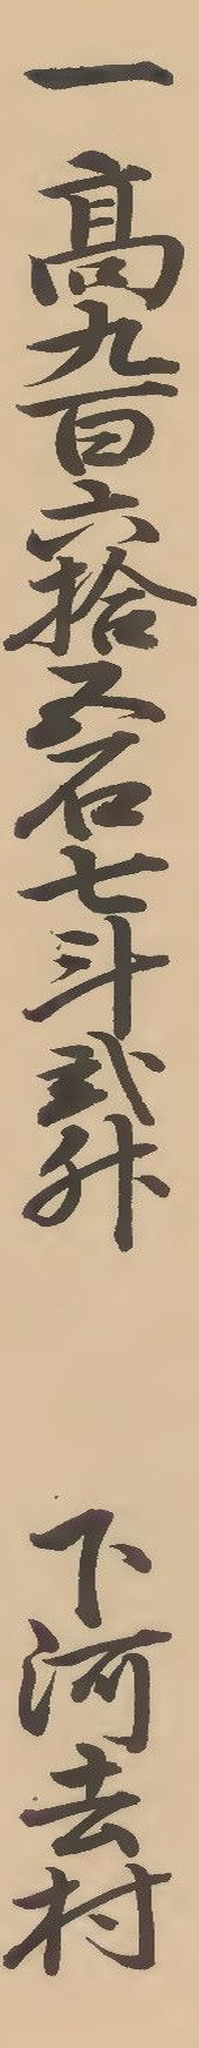一高九百六拾五石七斗弐升下河去村
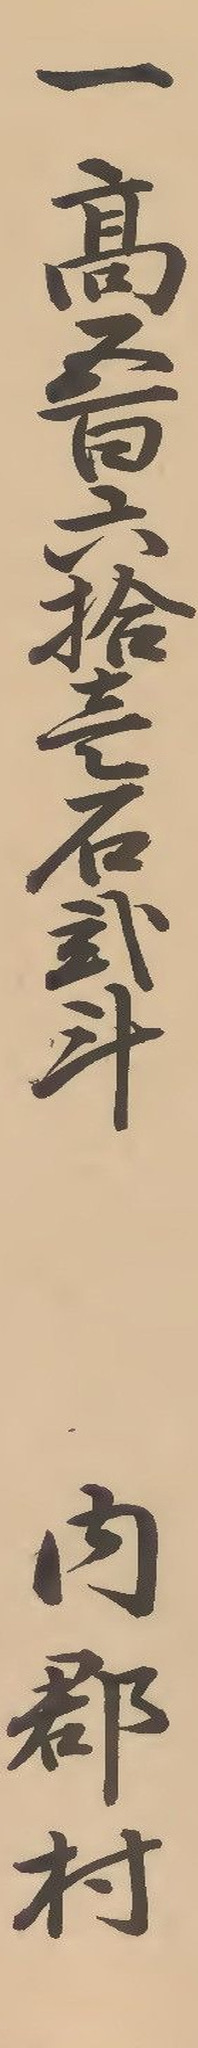一高五百六拾壱石弐斗内郡村
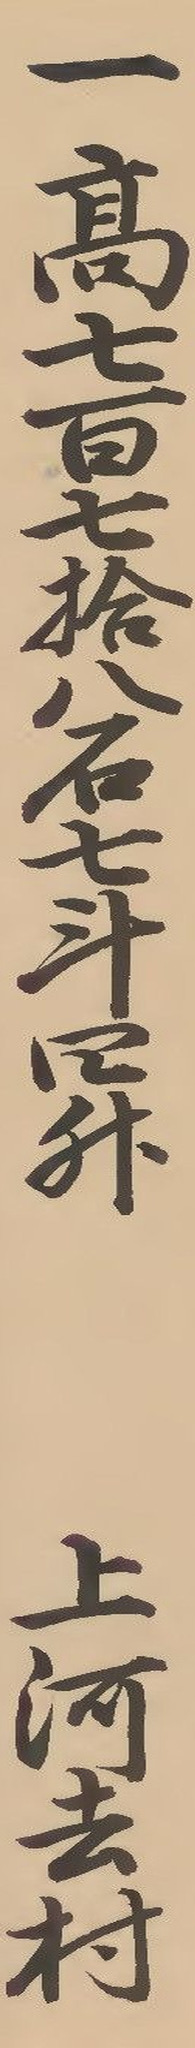一高七百七拾八石七斗四升上河去村
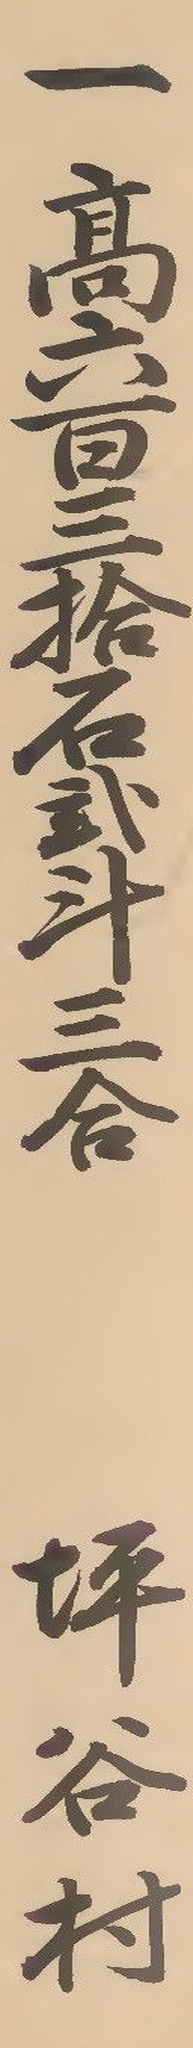一高六百三拾石弐斗三合坪谷村
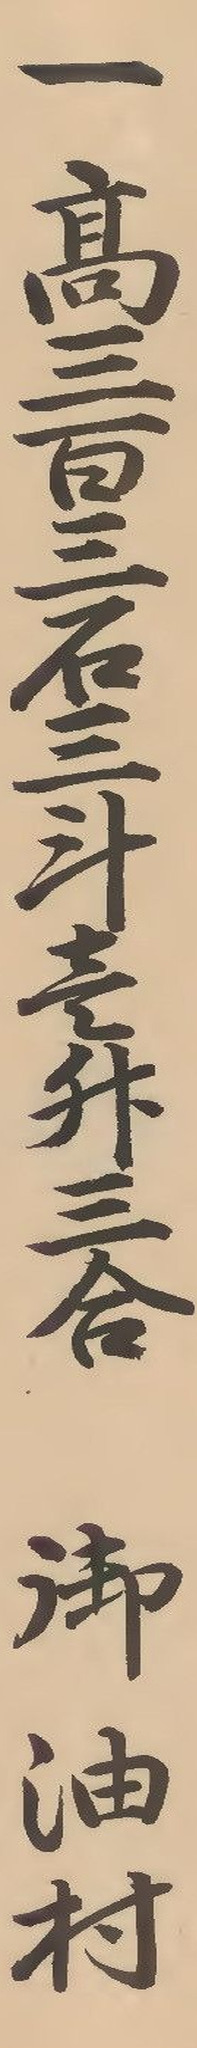一高三百三石三斗壱升三合御油村
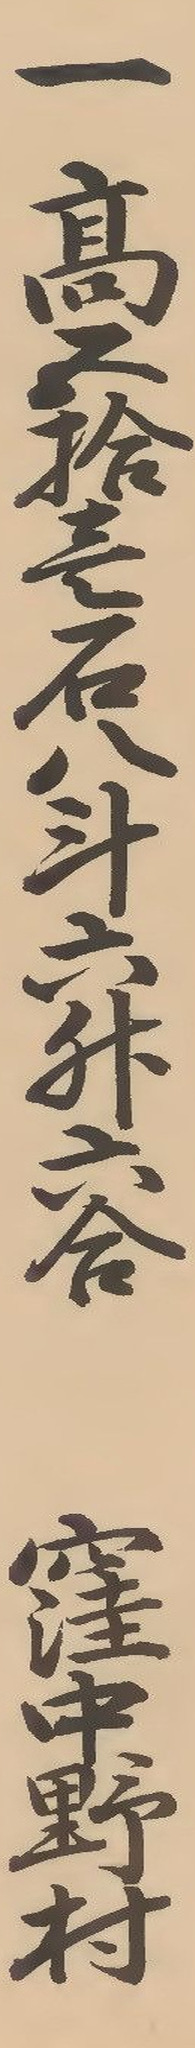一高五拾壱石八斗六升六合窪中野村
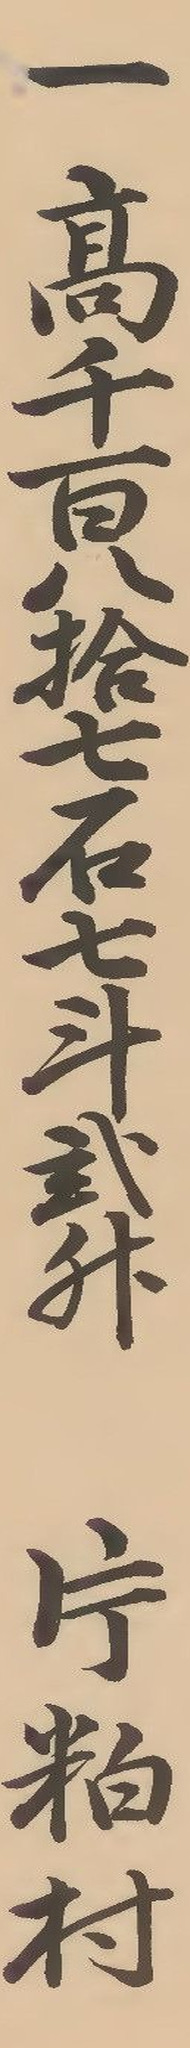一高千百八拾七石七斗弐升片粕村

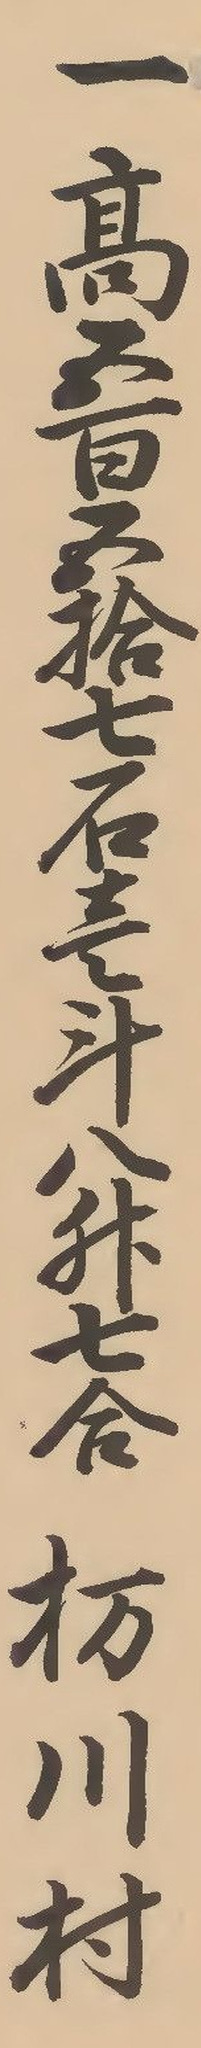一高五百五拾七石壱斗八升七合栃川村
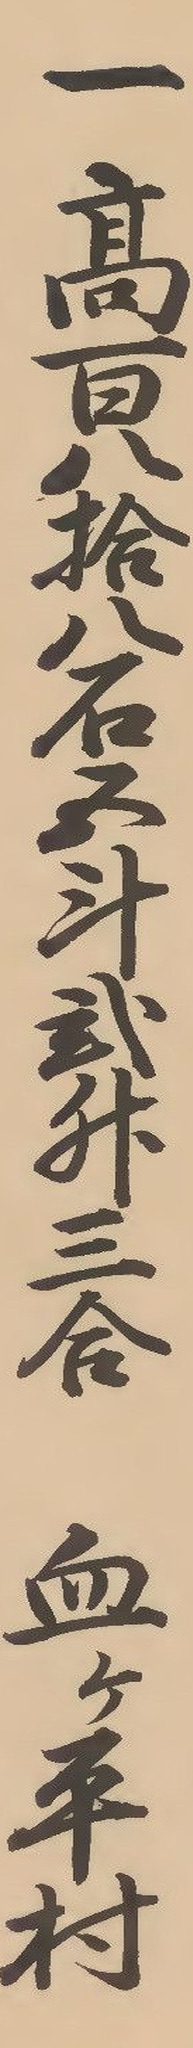一高百八拾八石五斗弐升三合血ヶ平村
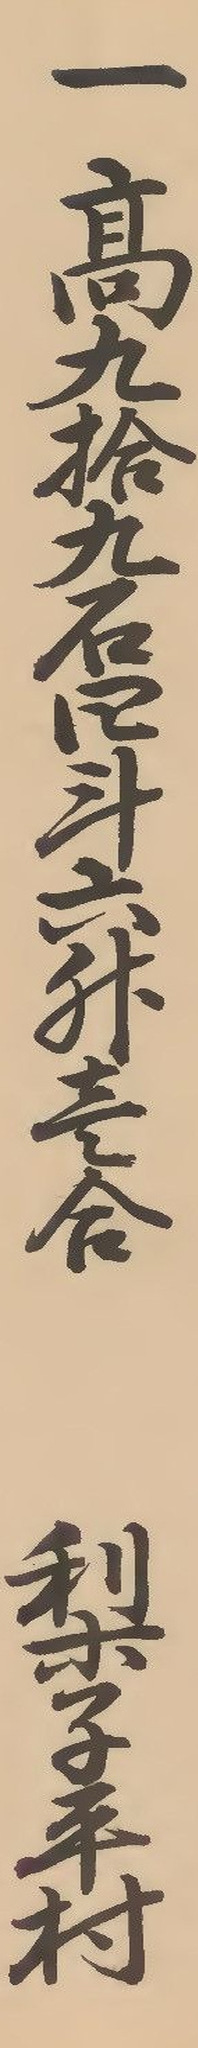一高九拾九石四斗六升壱合梨子平村
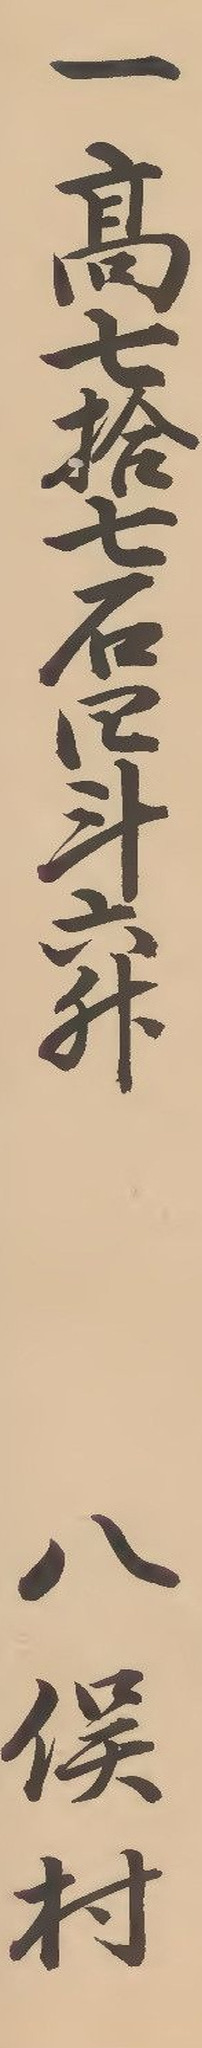一高七拾七石四斗六升八俣村
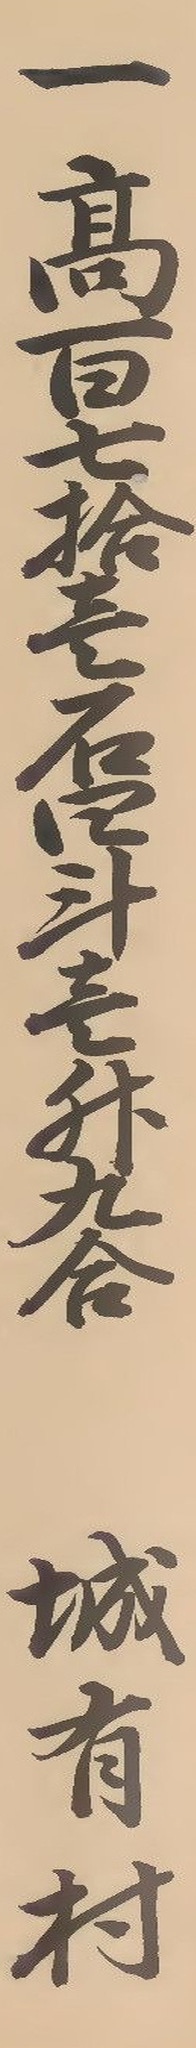一高百七拾壱石四斗壱升九合城有村
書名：越前国郷帳
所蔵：国立公文書館 National Archives of Japan
